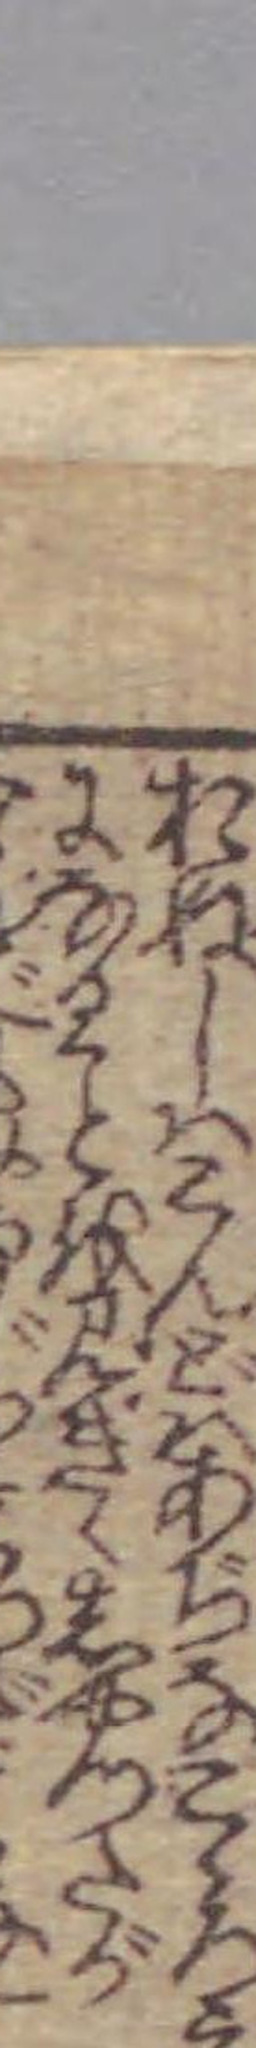になることを見きゝしやつたが
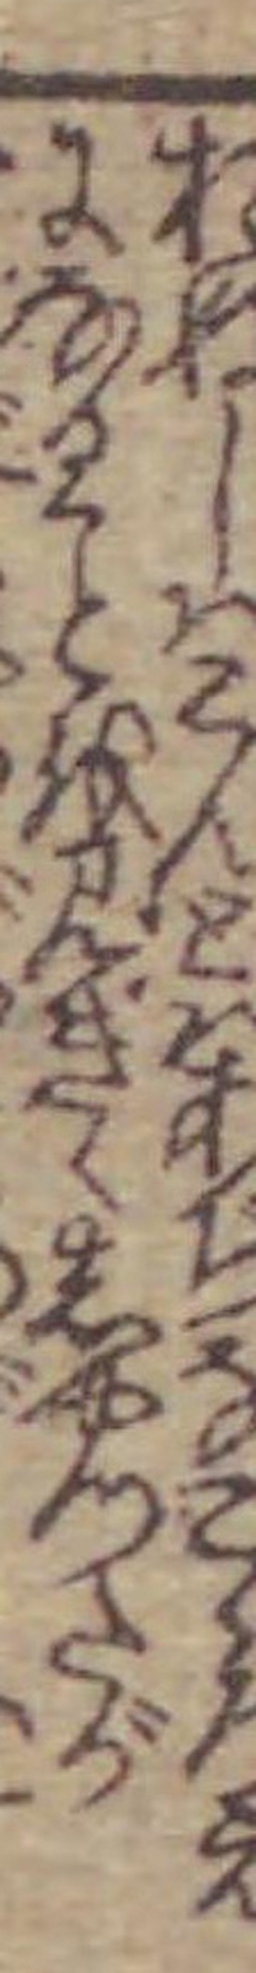になることを見きゝしやつたが
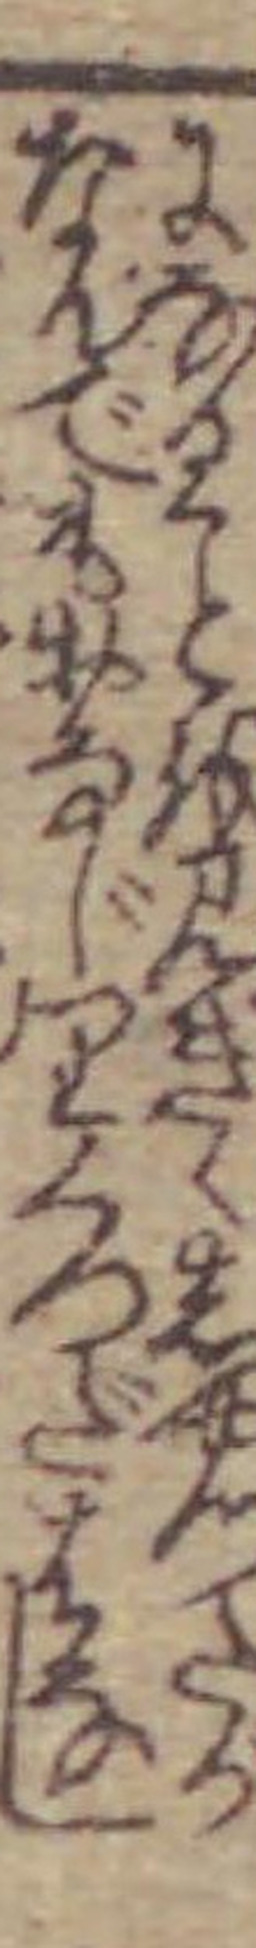なんでもおなじりくつだはなし
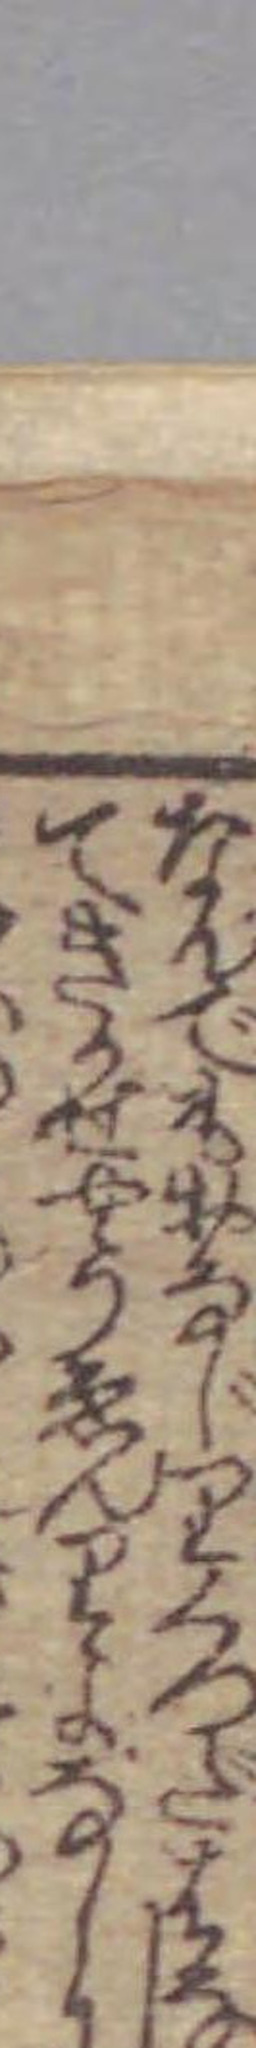てきかせやうゑんりよなしに
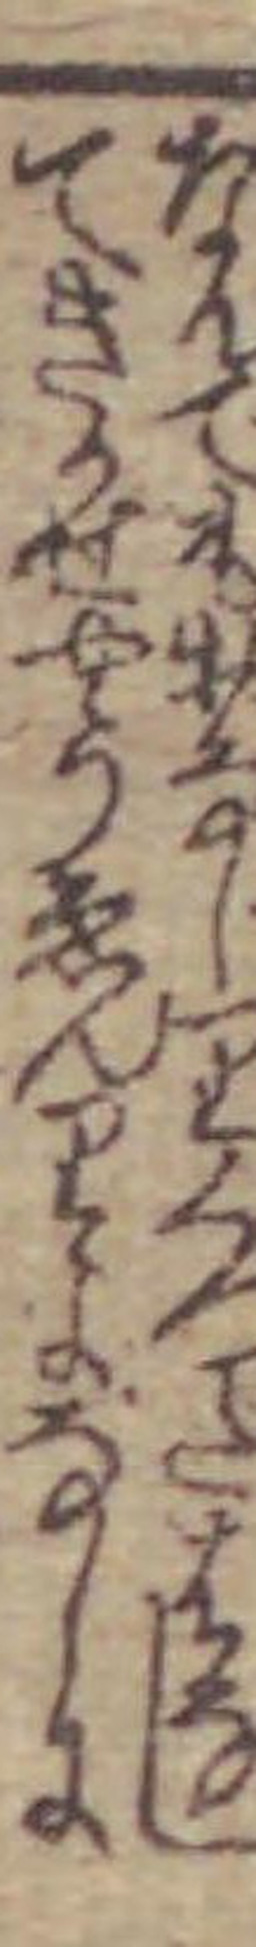てきかせやうゑんりよなしに
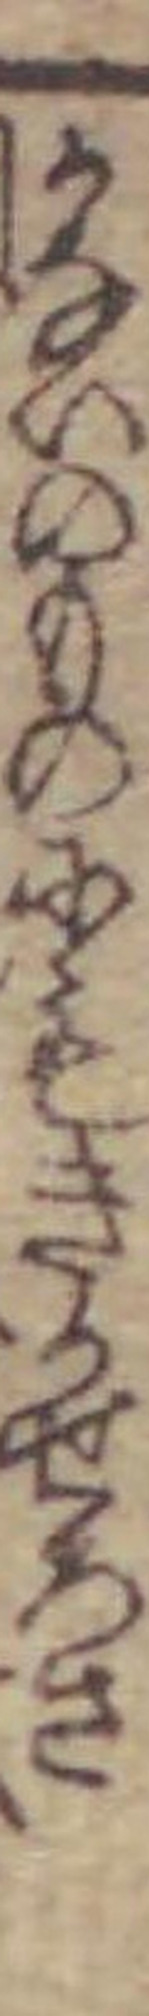かないのものにもきかせろさ
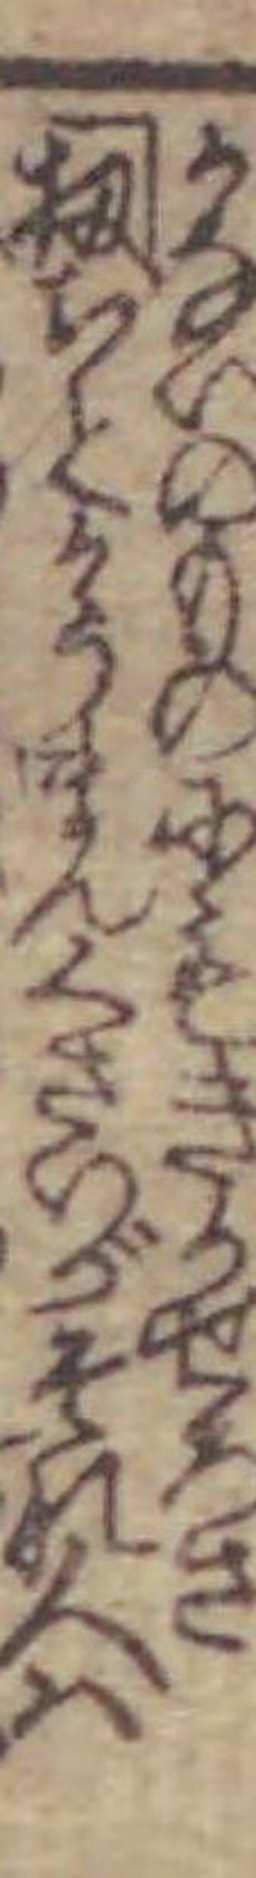〽扨ちとかうまんくさいがそれ人は
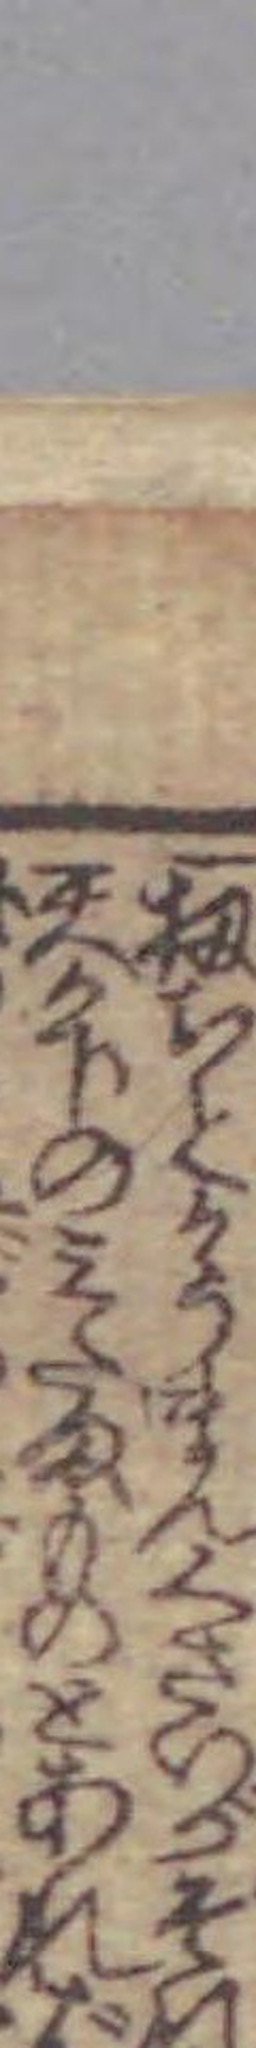天か下のみたまものとあれば天
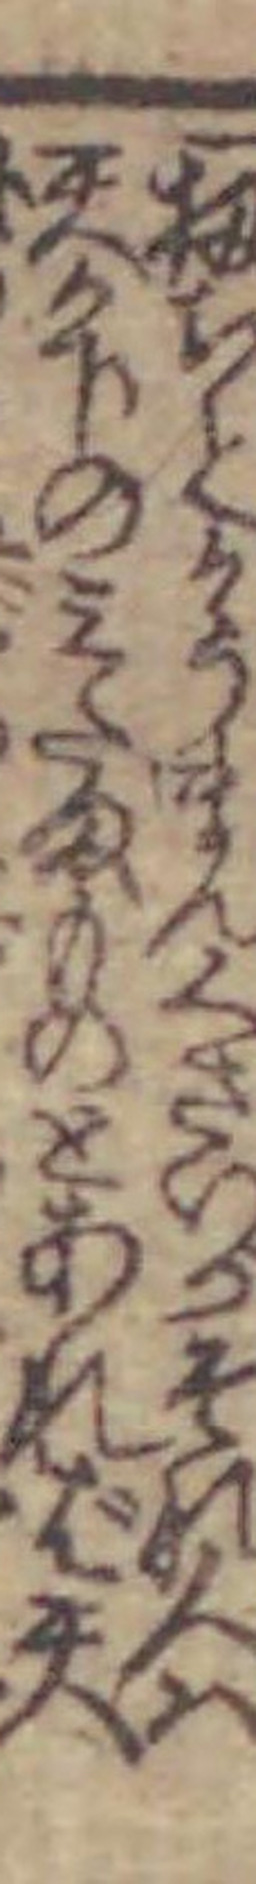天か下のみたまものとあれば天
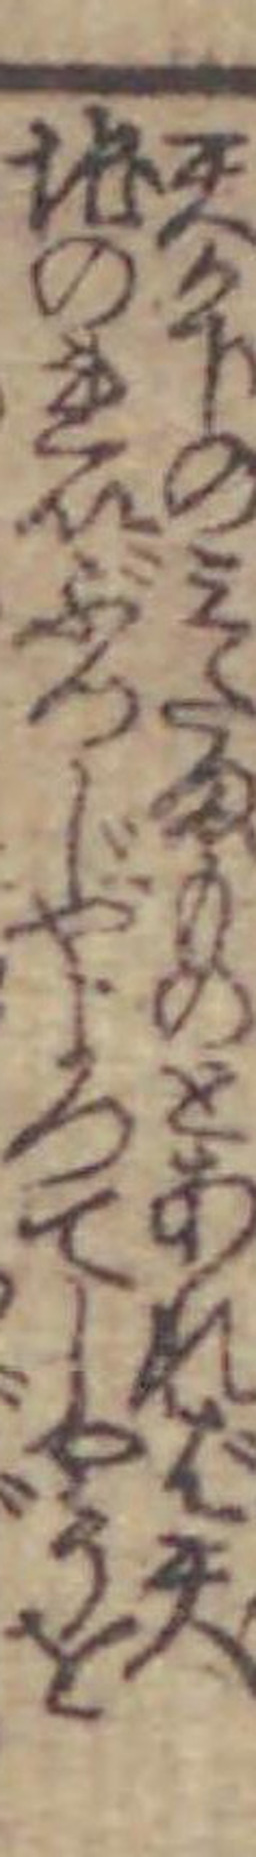地のれいぶつじやよつてしやうを
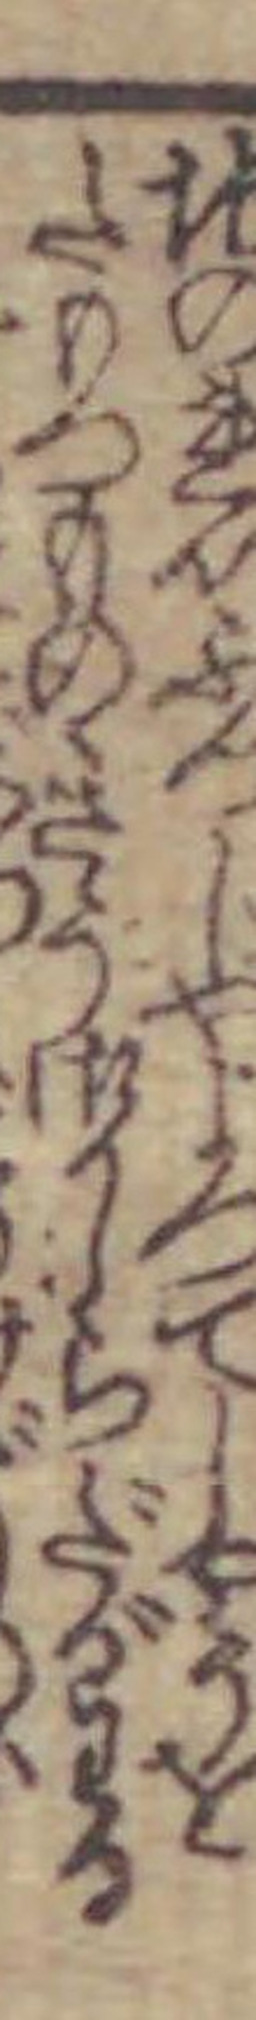たもつものゝさう御かしらだがわる
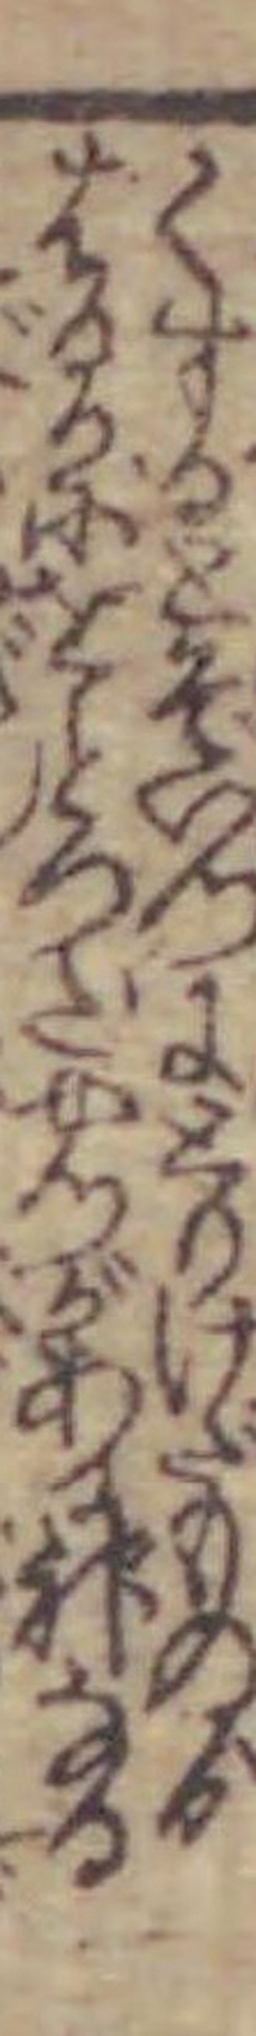はるかにをとつたやつがある神なる
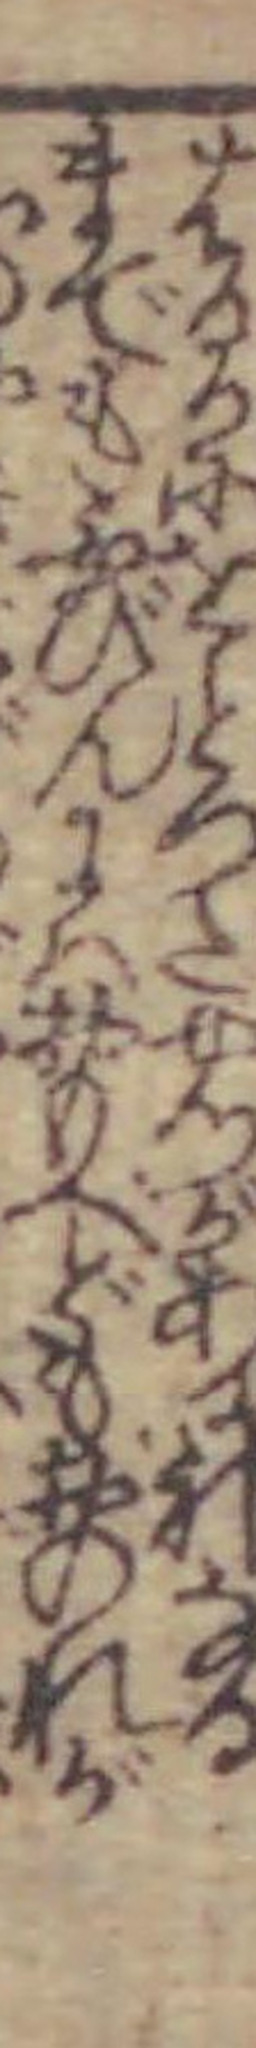までもふびんにおもへどもおのれが
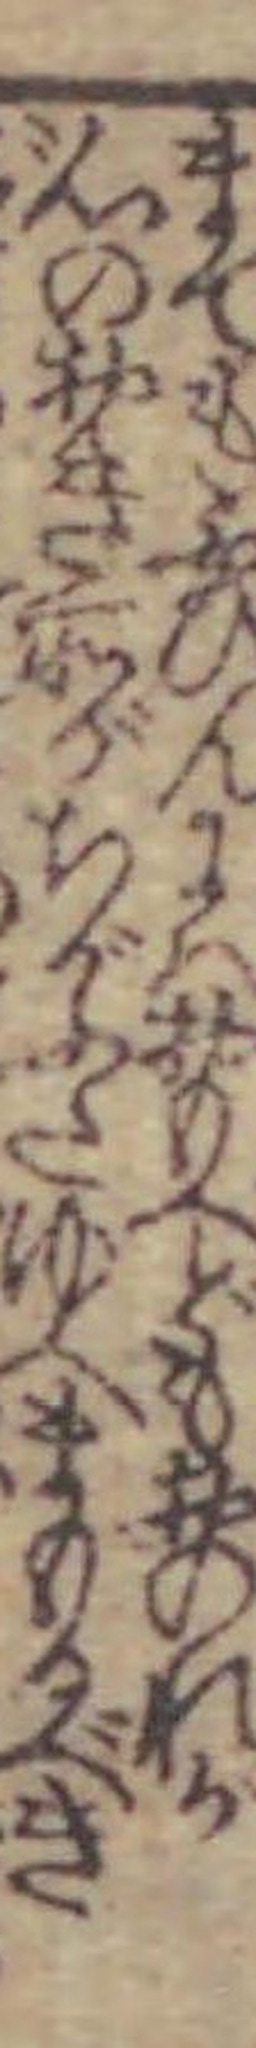心のおき所がちがふたゆへまもるべき
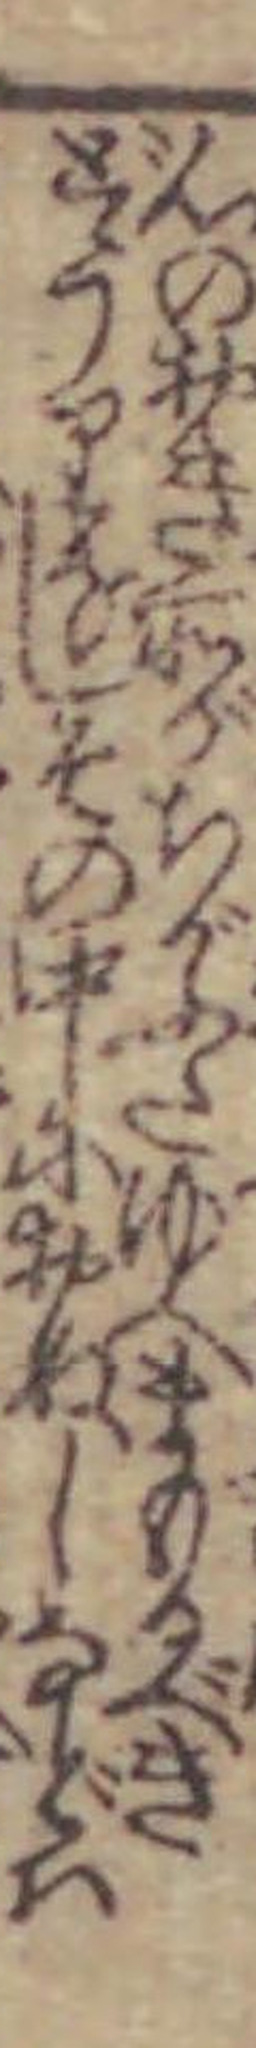どうりなしその中におぬしなどは
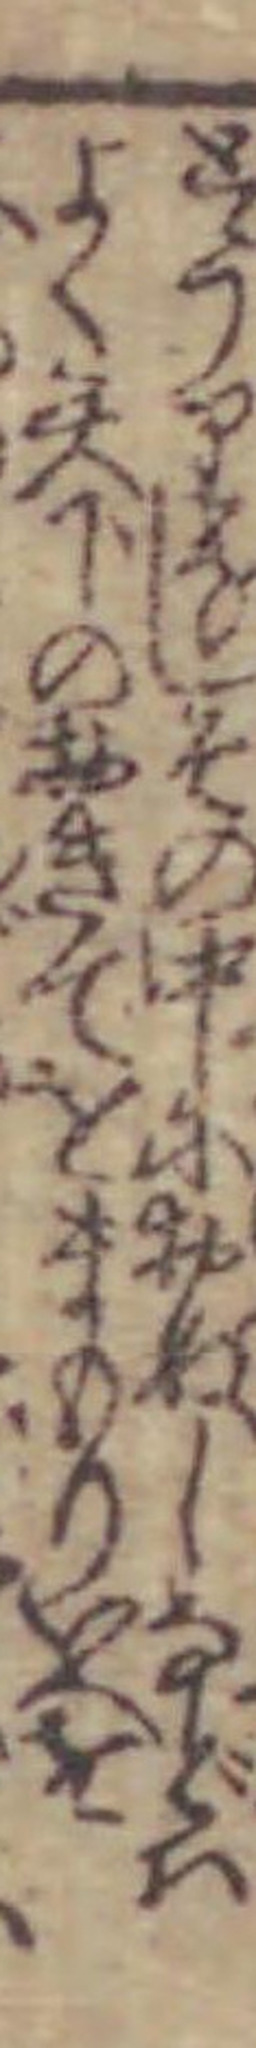よく天下のおきてをまもりいへを
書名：即席耳学問 : 3巻
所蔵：国立国会図書館 National Diet Library, JAPAN
